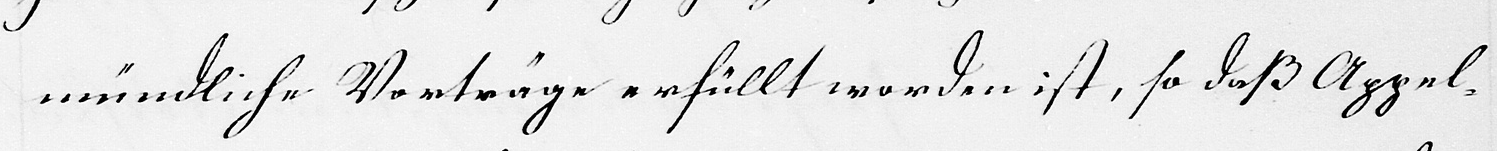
mündliche Vorträge erfüllt worden ist, so daß Appel¬
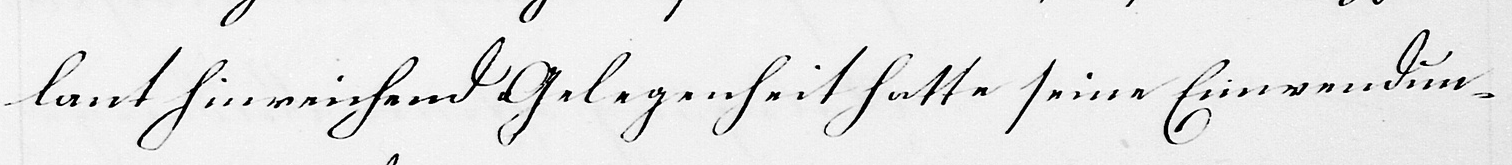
lant hinreichend Gelegenheit hatte seine Einwendun¬
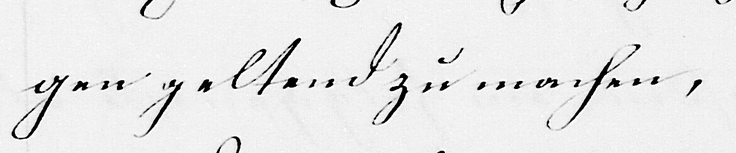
gen geltend zu machen,
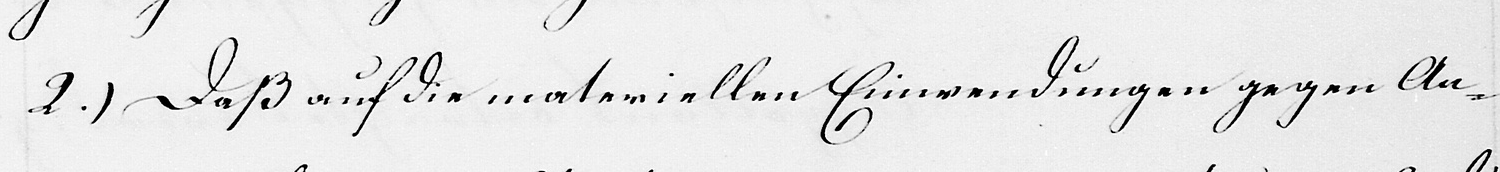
2.) Daß auf [sic!] die materiellen Einwendungen gegen An¬
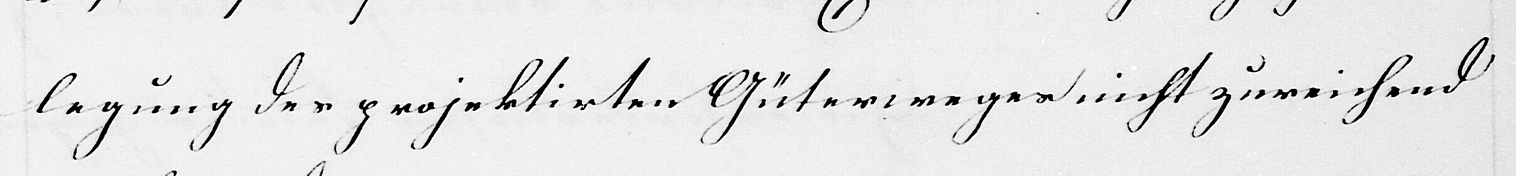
legung des projektirten Güterweges nicht zureichend
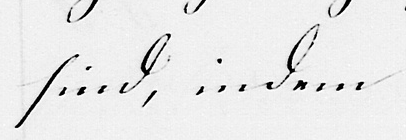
sind, indem
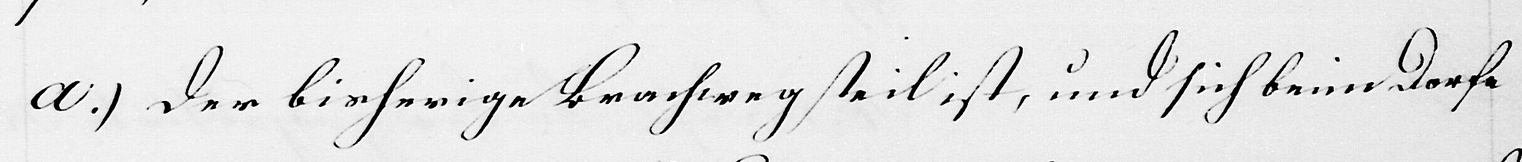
a.) Der bisherige Brachweg steil ist, und sich beim Dorfe
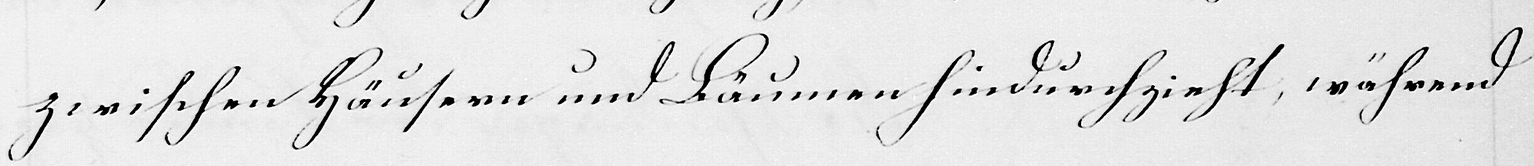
zwischen Häusern und Bäumen hindurchzieht, während
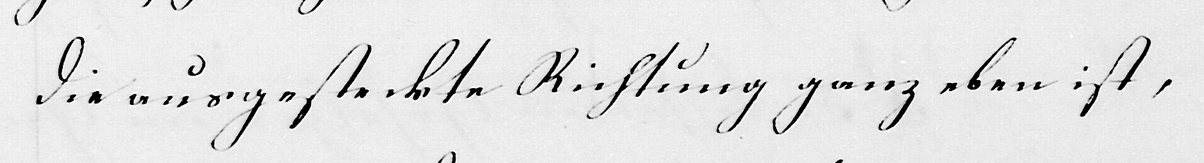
die ausgesteckte Richtung ganz oben ist,
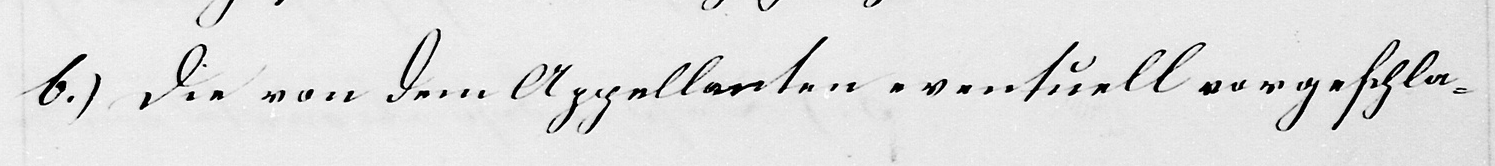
b.) Die von dem Appellanten eventuell vorgeschla-
